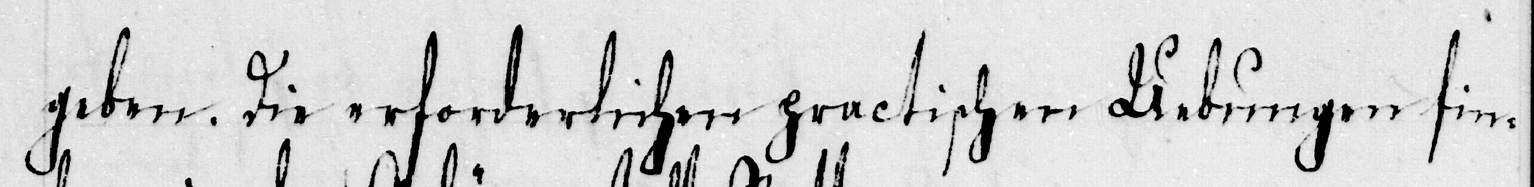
geben. Die erforderlichen practischen Uebungen fin¬
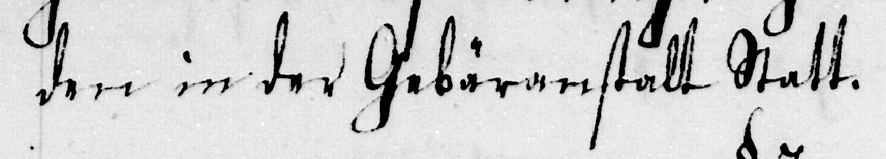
den in der Gebäranstalt Statt.
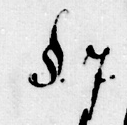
§. 7.
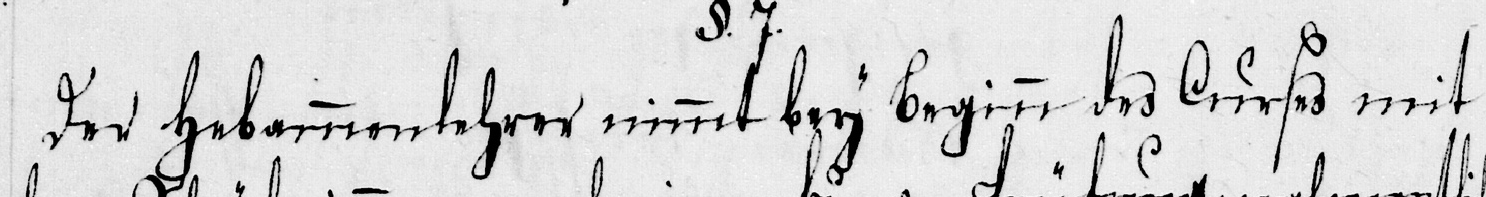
Der Hebammenlehrer nimmt bey Beginn des Curses mit
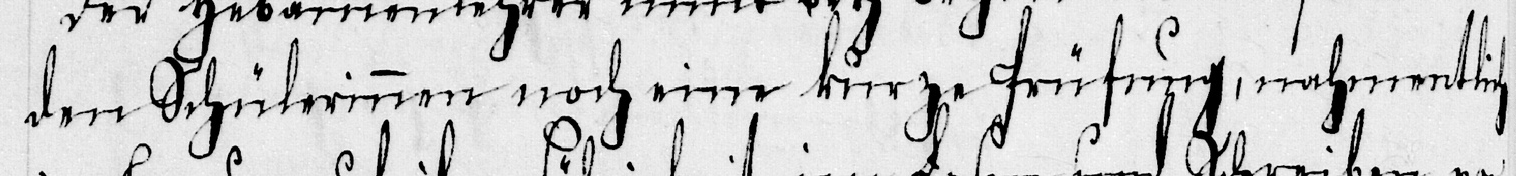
den Schülerinnen noch eine kurze Prüfung, nahmentli¬
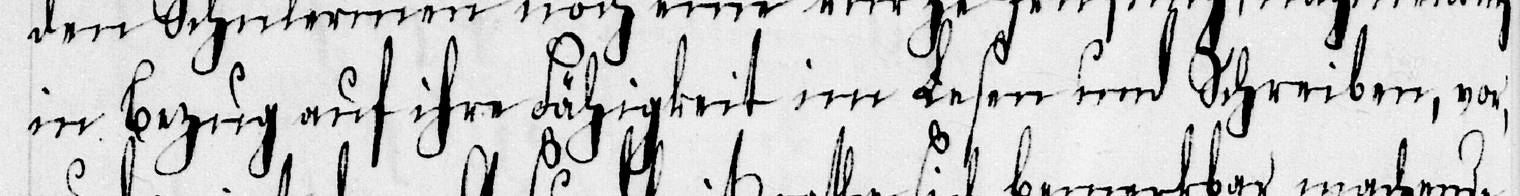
in Bezug auf ihre Fähigkeit im Lesen und Schreiben, vo¬
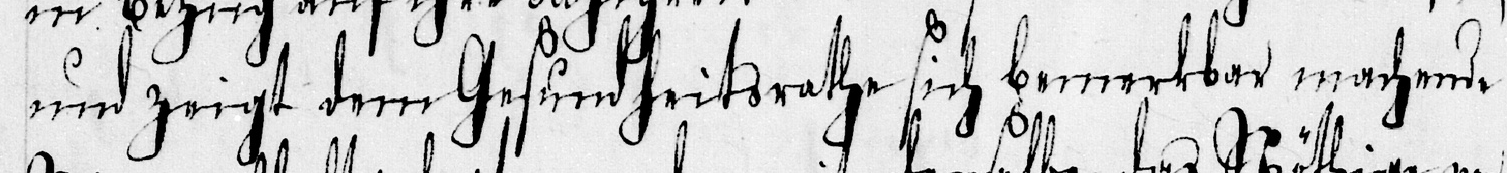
und zeigt dem Gesundheitsrathe sich bemerkbar machende
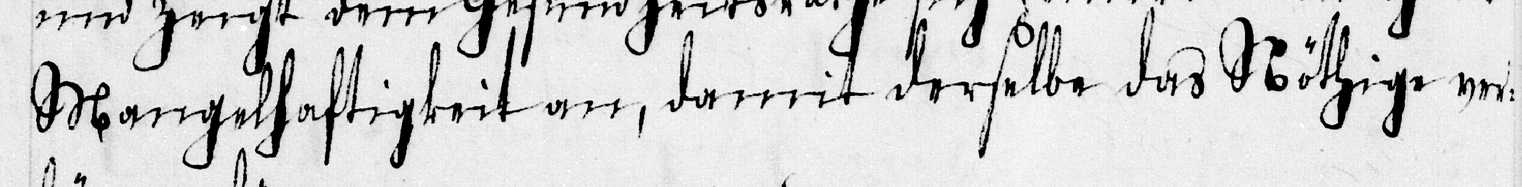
Mangelhaftigkeit an, damit derselbe das Nöthige ver¬
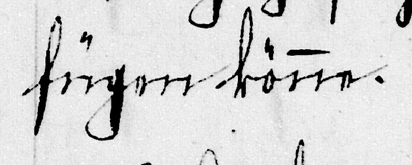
fügen könne.
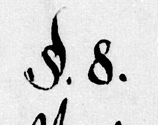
§. 8.
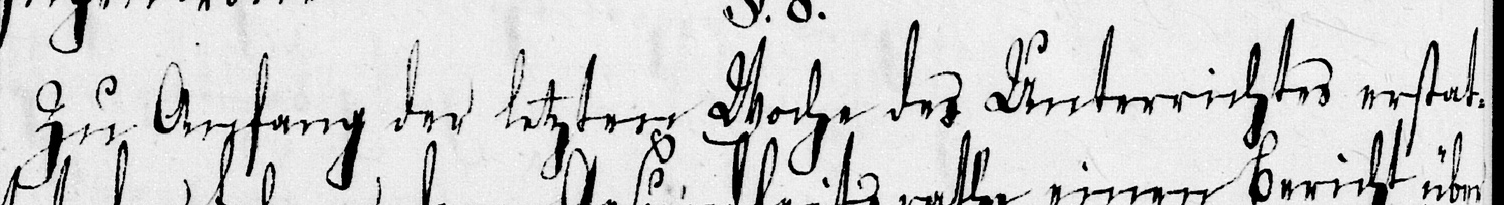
Zu Anfang der letzten Woche des Unterrichtes erstat¬
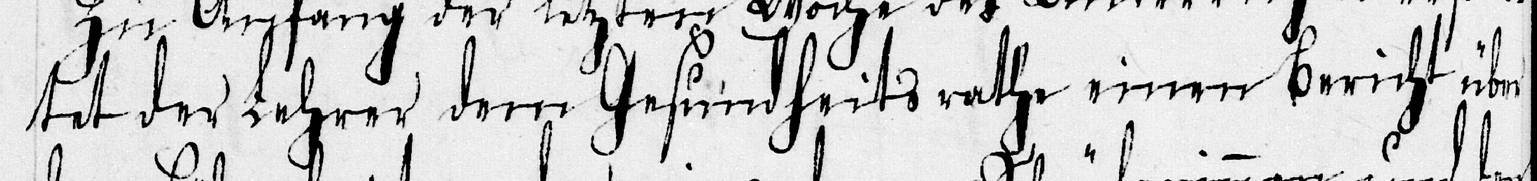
tet der Lehrer dem Gesundheitsrathe einen Bericht üb¬
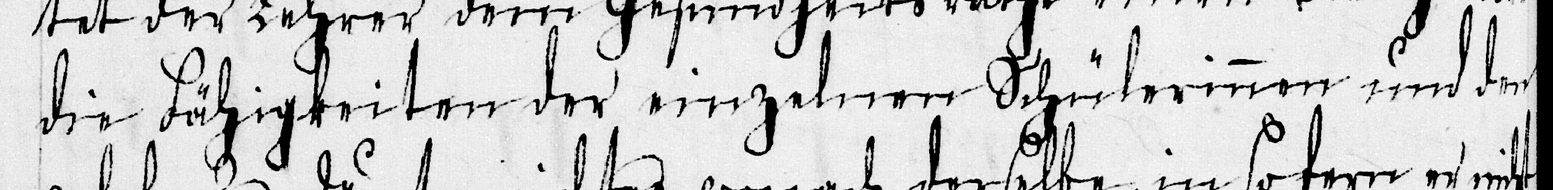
die Fähigkeiten der einzelnen Schülerinnen und den
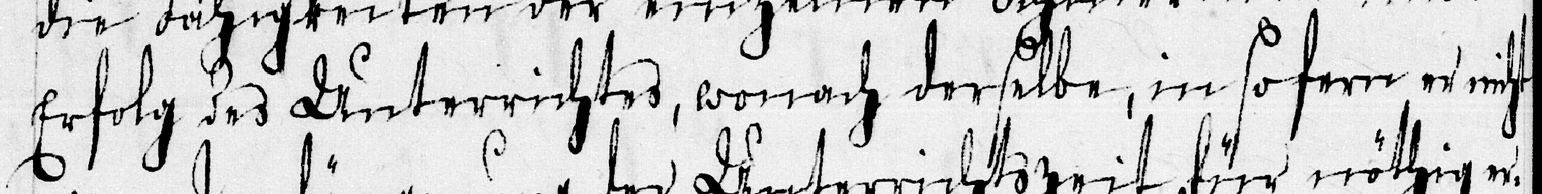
Erfolg des Unterrichtes, wonach derselbe, in sofern er nicht
